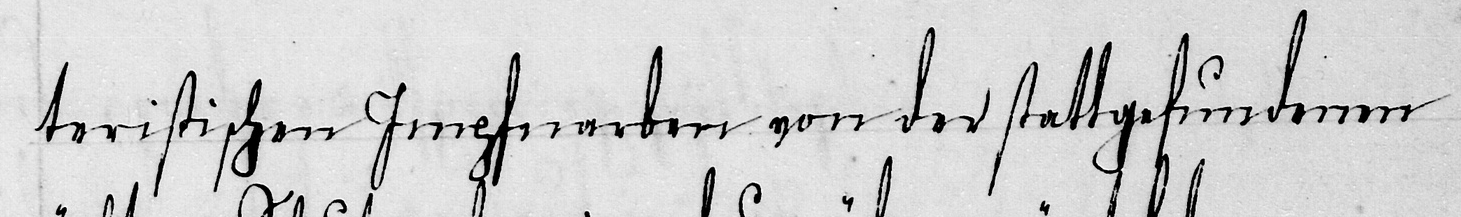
teristischen Impfnarben von der stattgefundenen
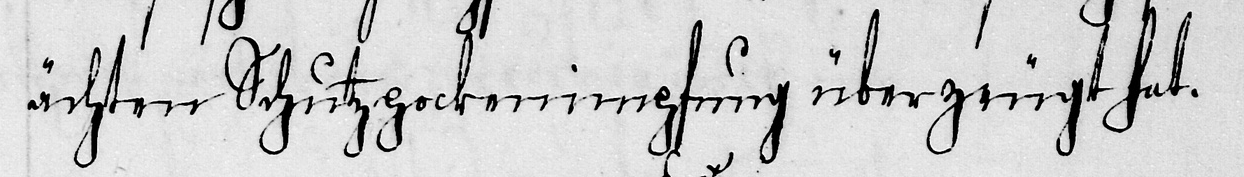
ächten Schutzpockenimpfung überzeugt hat.
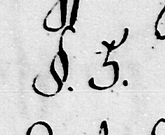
§. 5.
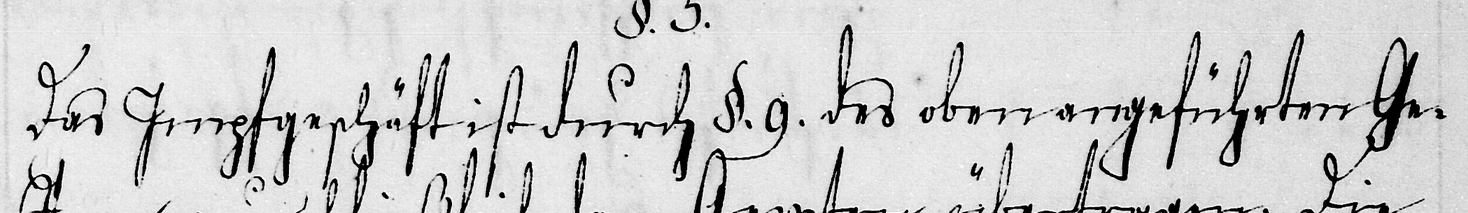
Das Impfgeschäft ist durch §. 9. des oben angeführ¬
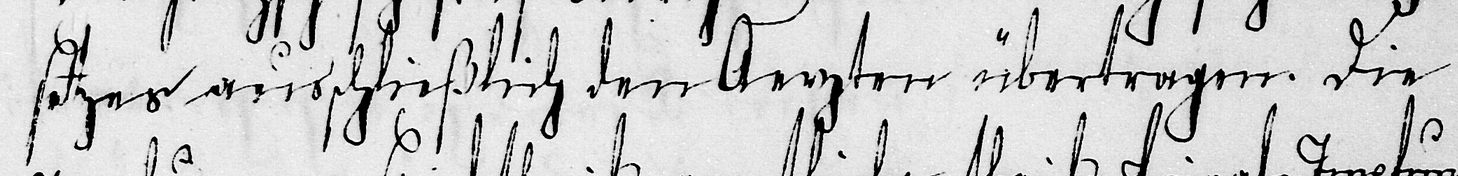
setzes ausschließlich den Aerzten übertragen. Die
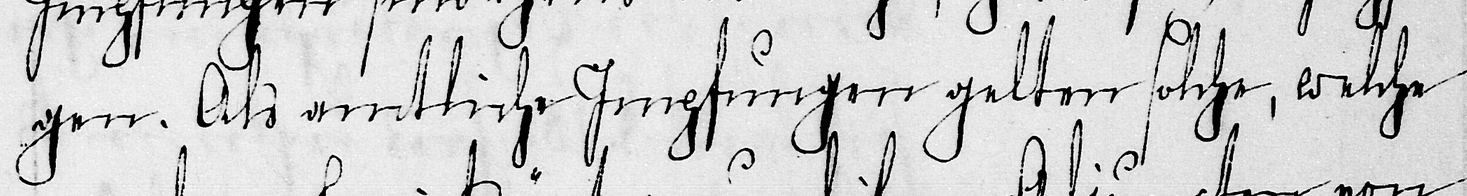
gen. Als amtliche Impfungen gelten solche, welche
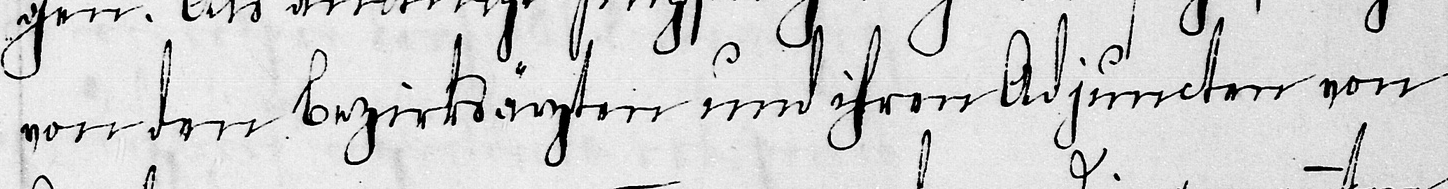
von den Bezirksärzten und ihren Adjuncten von
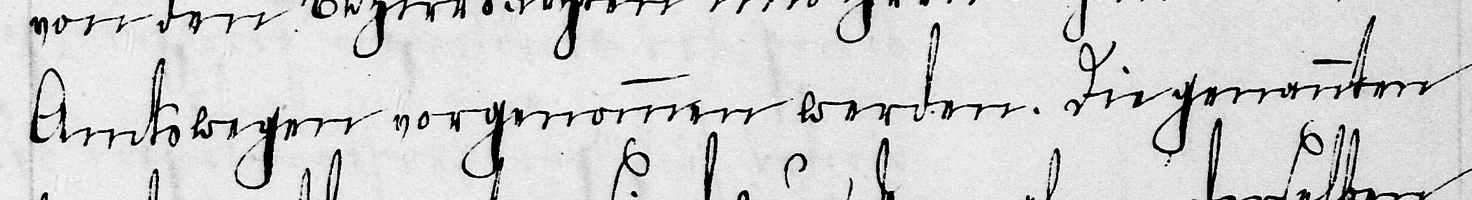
Amtswegen vorgenommen werden. Die genannten
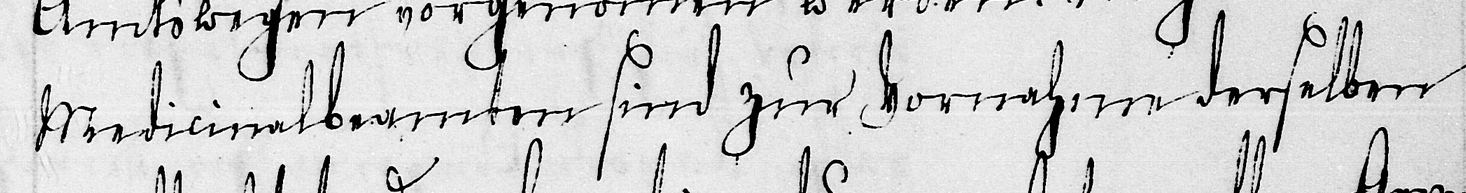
Medicinalbeamten sind zur Vornahme derselben
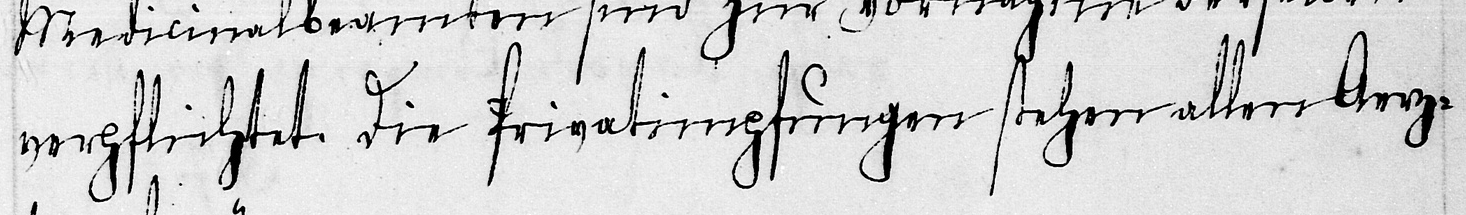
verpflichtet. Die Privatimpfungen stehen allen Aerz¬
